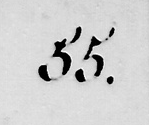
25.
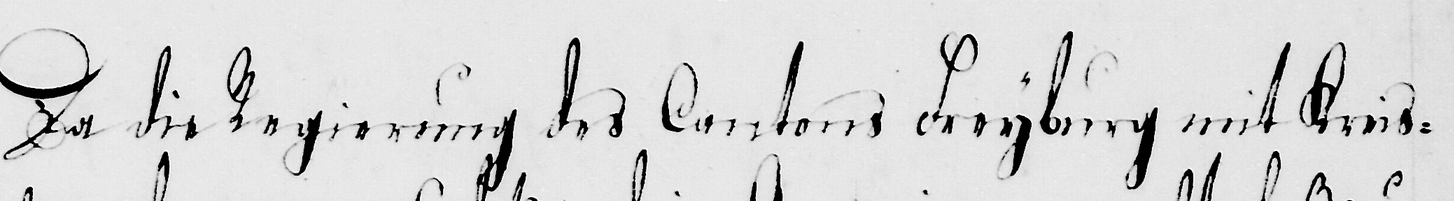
Da die Regierung des Cantons Freyburg mit Kreis¬
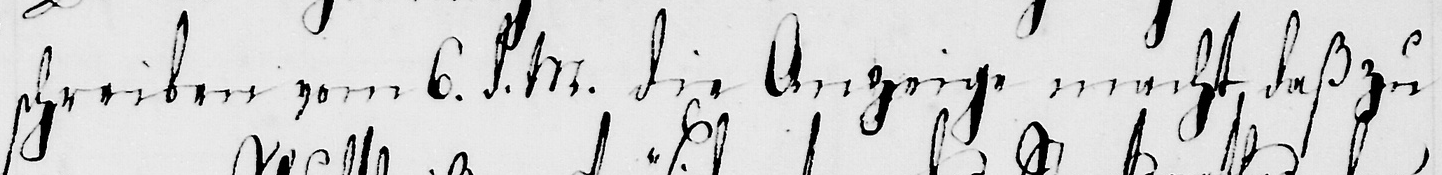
schreiben vom 6. d. M. die Anzeige macht, daß zu
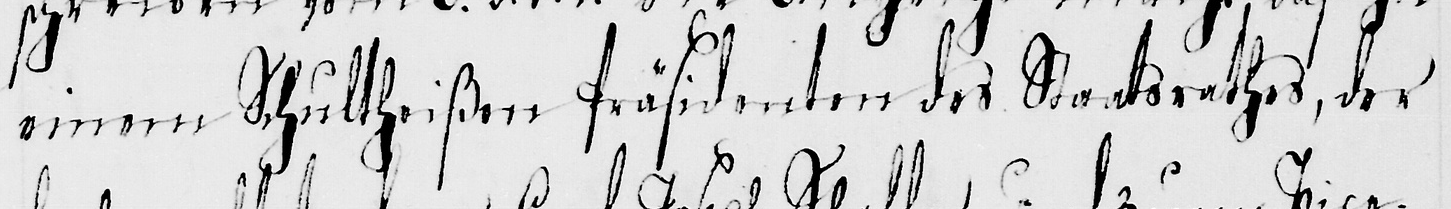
einem Schultheißen Präsidenten des Staatsrathes, der
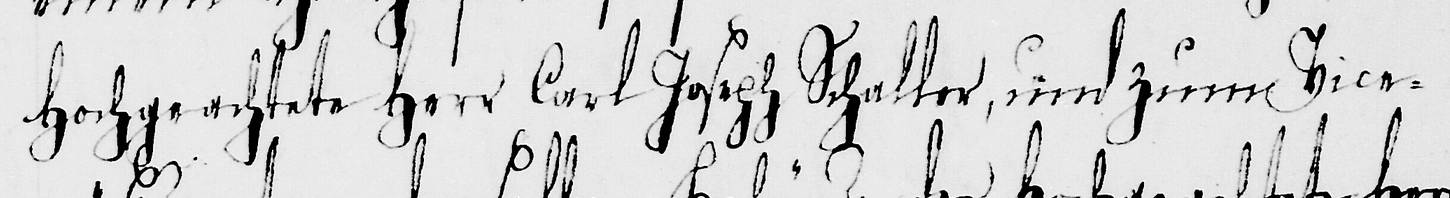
Hochgeachtete Herr Carl Joseph Schaller, und zum Vice¬
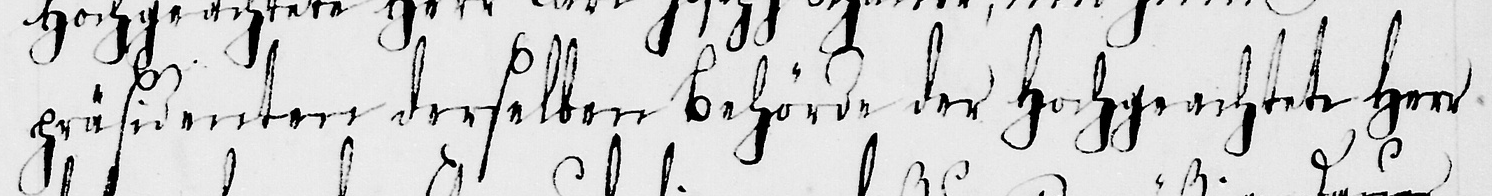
präsidenten derselben Behörde der Hochgeachtete Herr
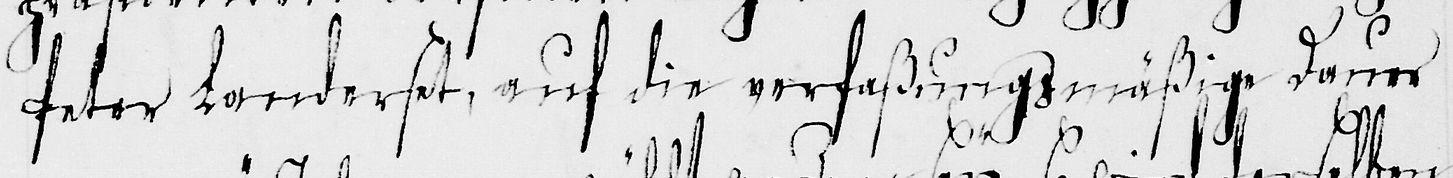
Peter Landerset, auf die verfaßungsmäßige Dauer
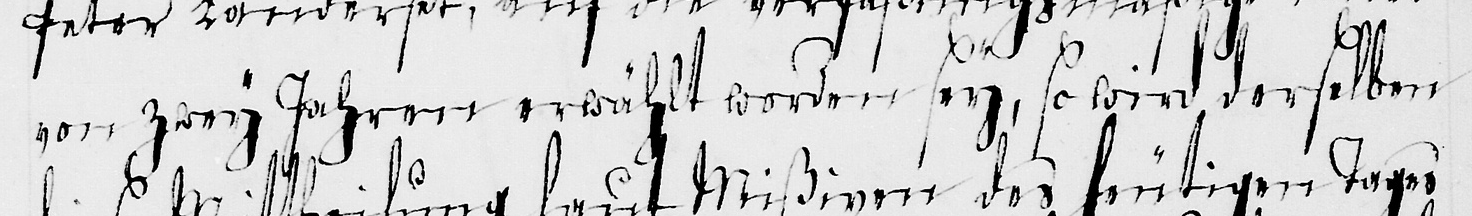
von zwey Jahren erwählt worden sey, so wird derselben
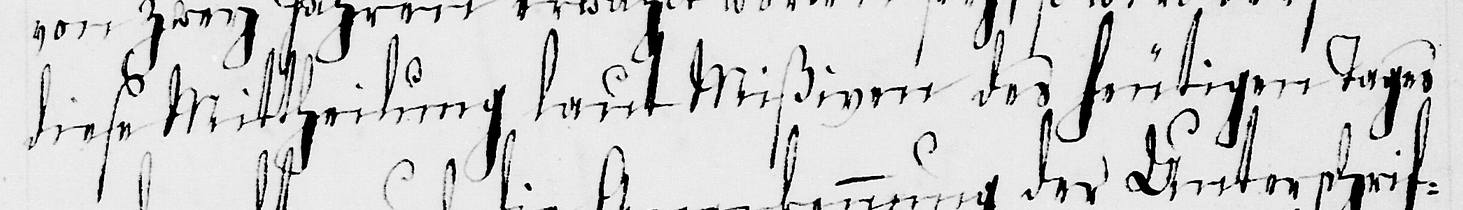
diese Mittheilung laut Mißiven des heutigen Tages
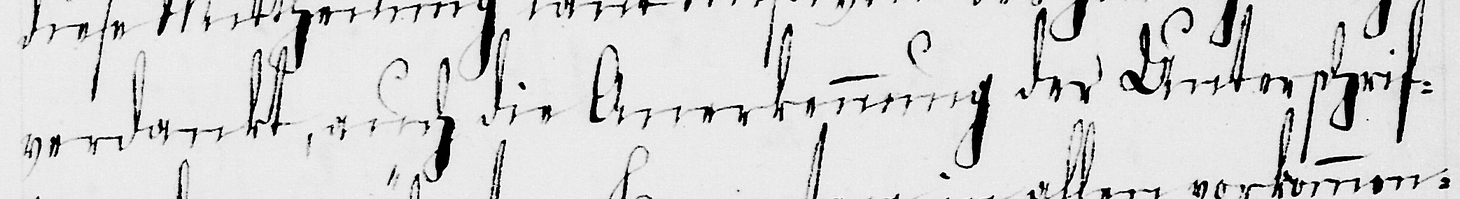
verdankt, auch die Anerkennung der Unterschrif¬
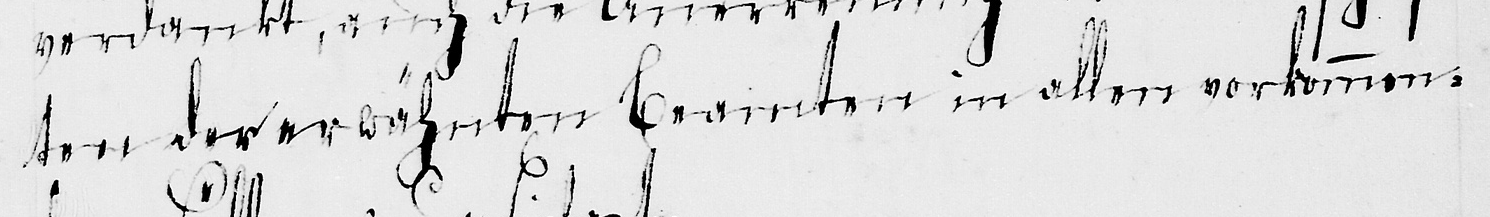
ten der erwähnten Beamten in allen vorkommen¬
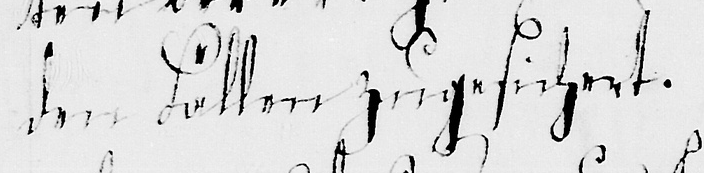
den Fällen zugesichert.
